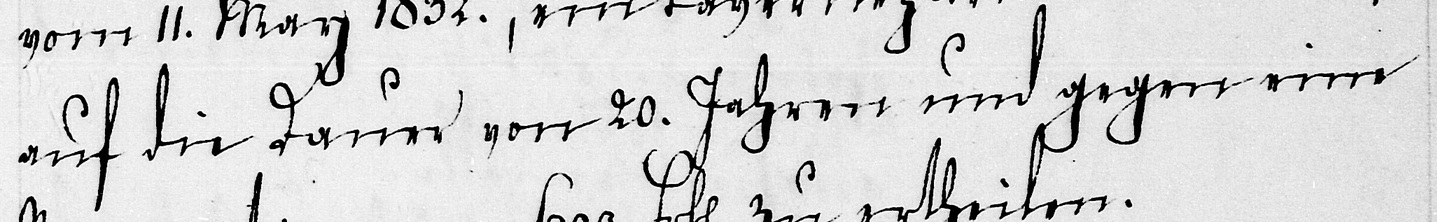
auf die Dauer von 20. Jahren und gegen eine
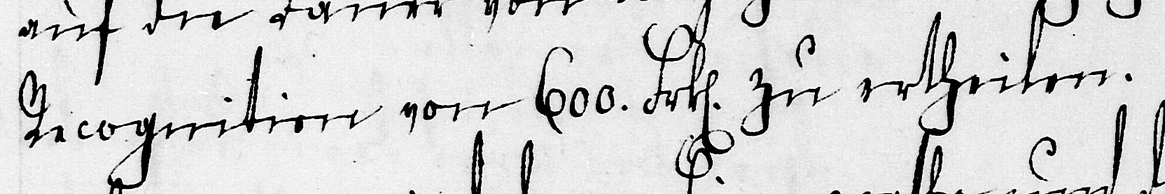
Recognition von 600. Frk[en]. zu ertheilen.
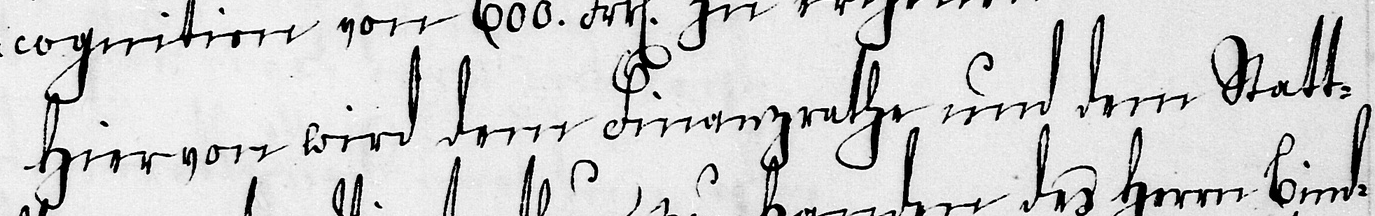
Hiervon wird dem Finanzrathe und dem Statt¬
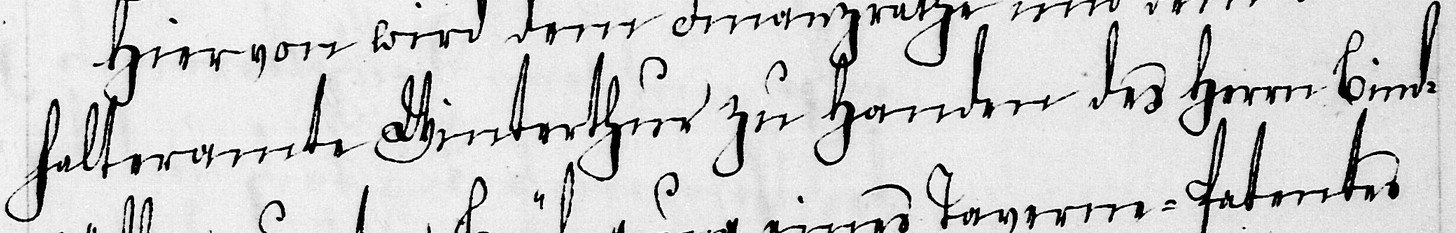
halteramte Winterthur zu Handen des Herrn Bind¬
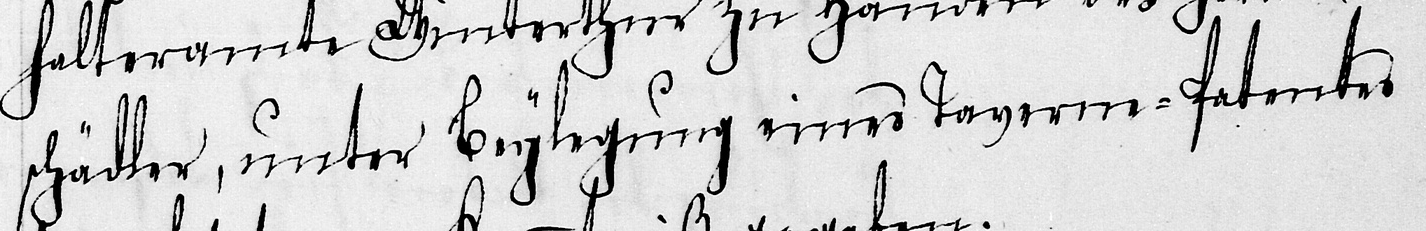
schädler, unter Beylegung eines Taverne-Patentes
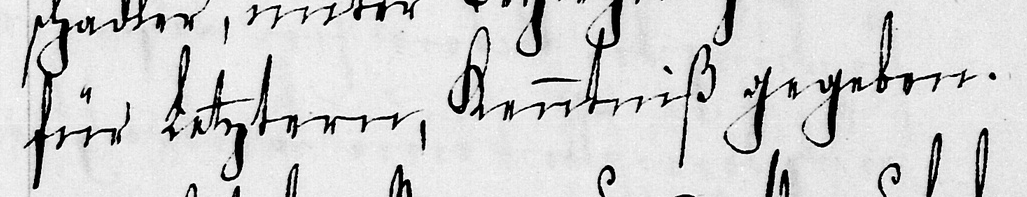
für Letztern, Kenntniß gegeben.
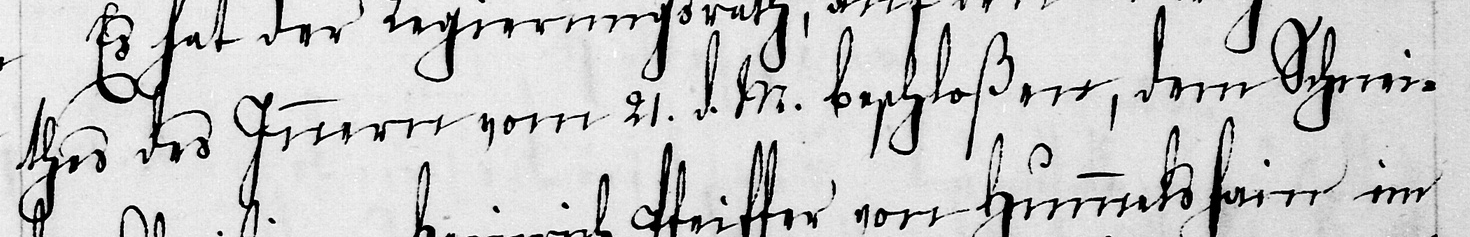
thes des Innern vom 21. d. M. beschloßen, dem Schnei¬
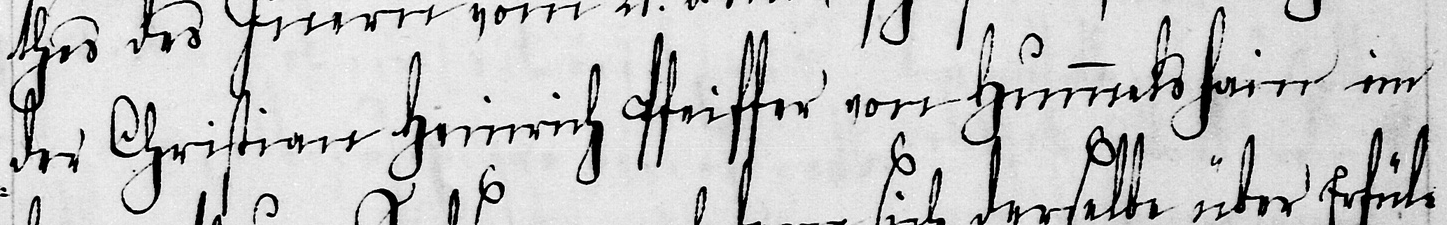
der Christian Heinrich Pfeiffer von Hummelshain im
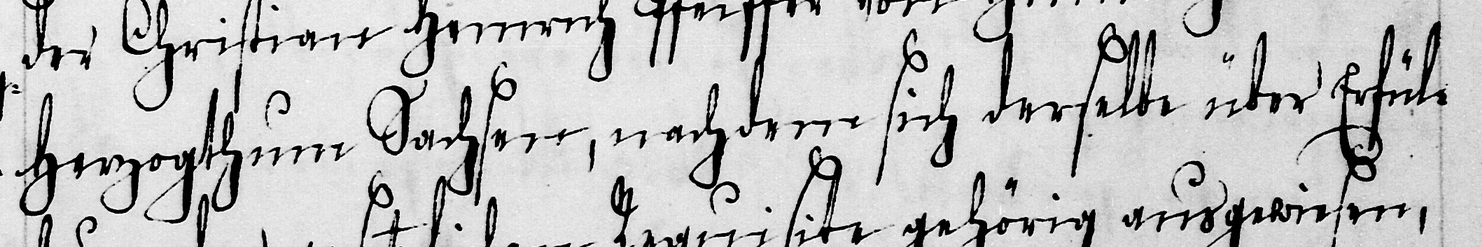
Herzogthum Sachsen, nachdem sich derselbe über Erfü¬
